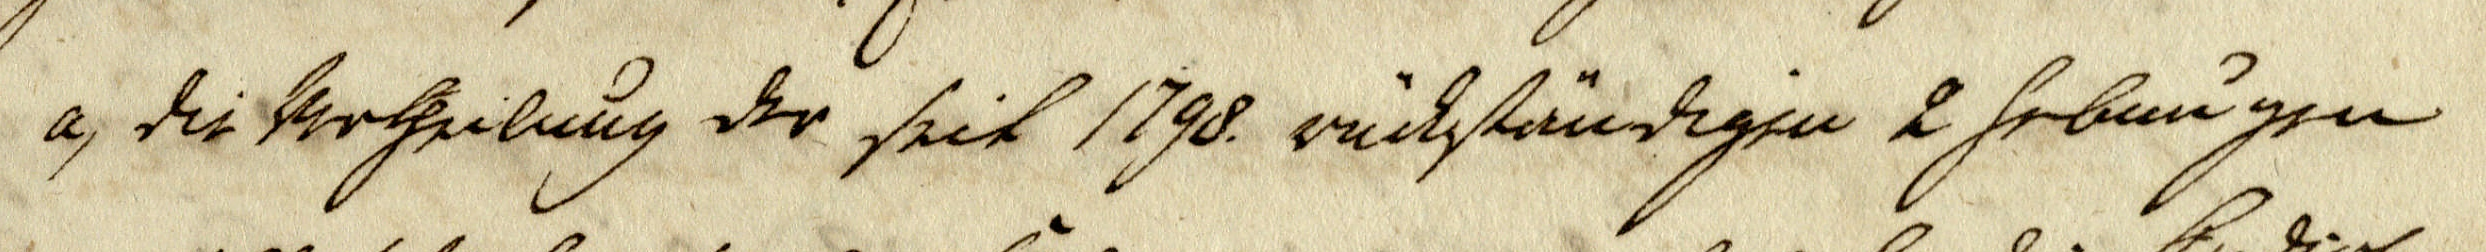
a, die Vertheilung der seit 1798. rückständigen 2 Hebungen
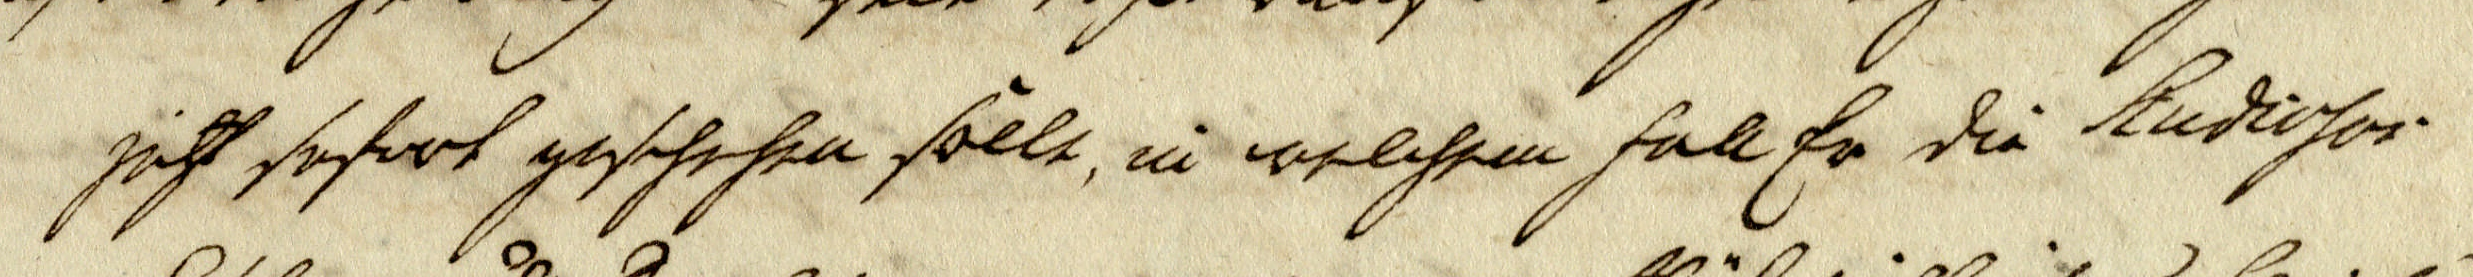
jetzt sofort geschehen solle, in welchem Fall Er die Studiosos
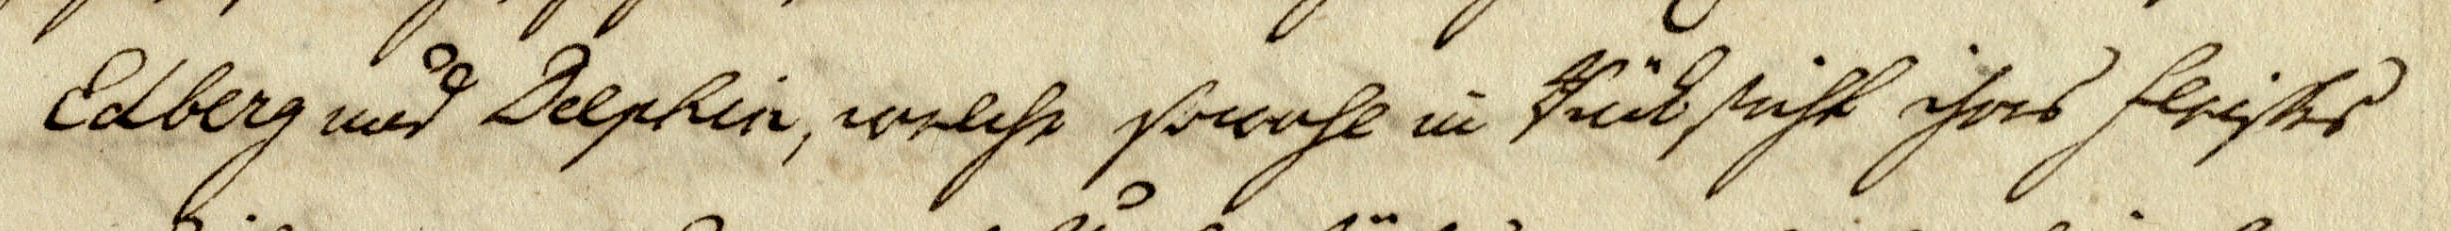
Edberg und Delphin, welche sowohl in Rücksicht ihres Fleisses
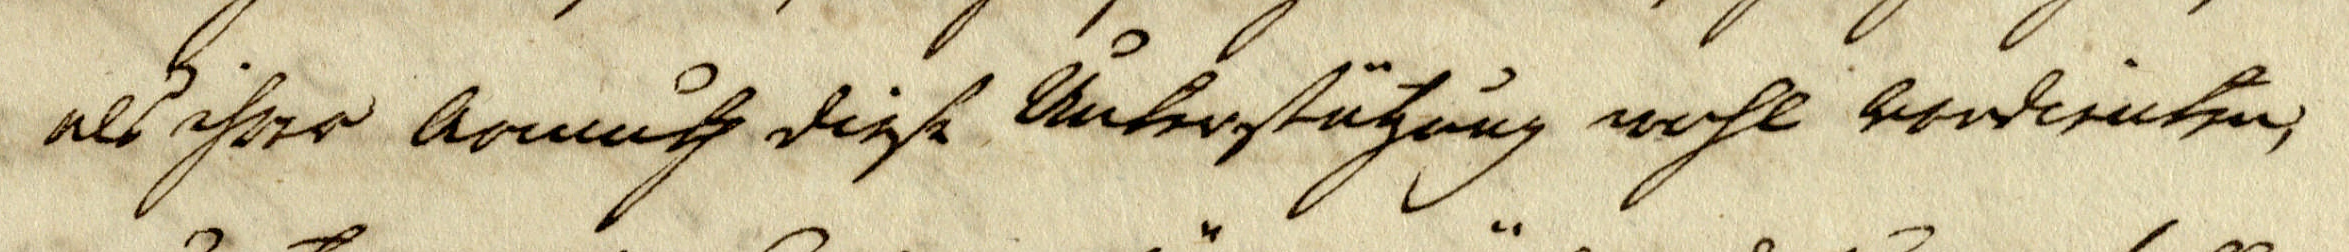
als ihrer Armuth diese Unterstützung wohl verdienten,
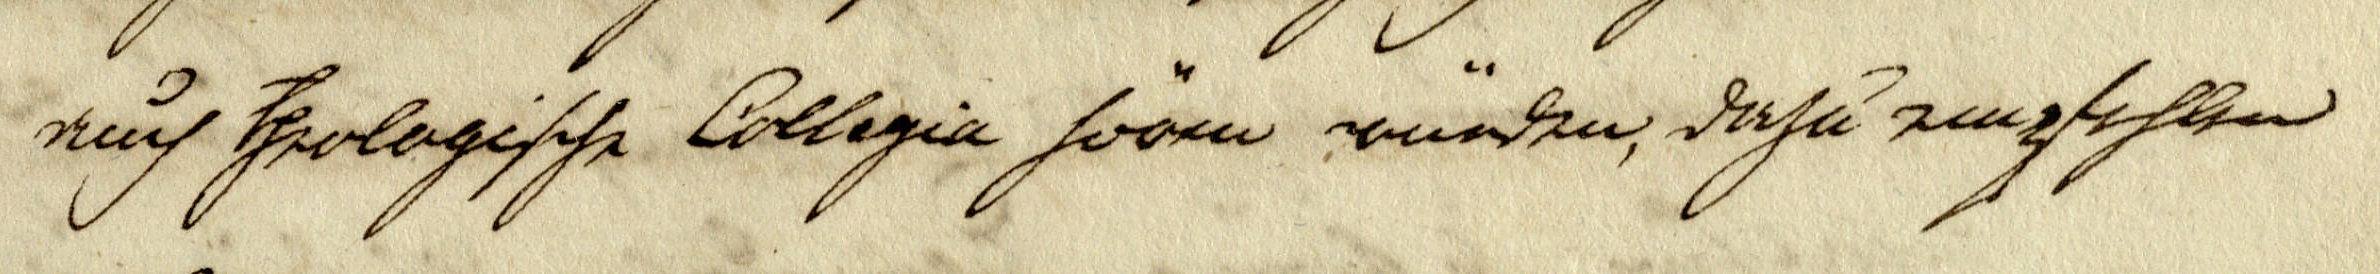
auch theologische Collegia hören würden, dazu empfehlen
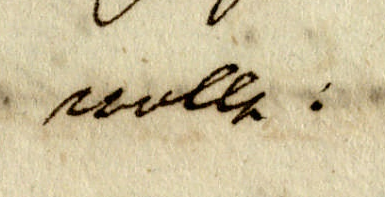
wolle:
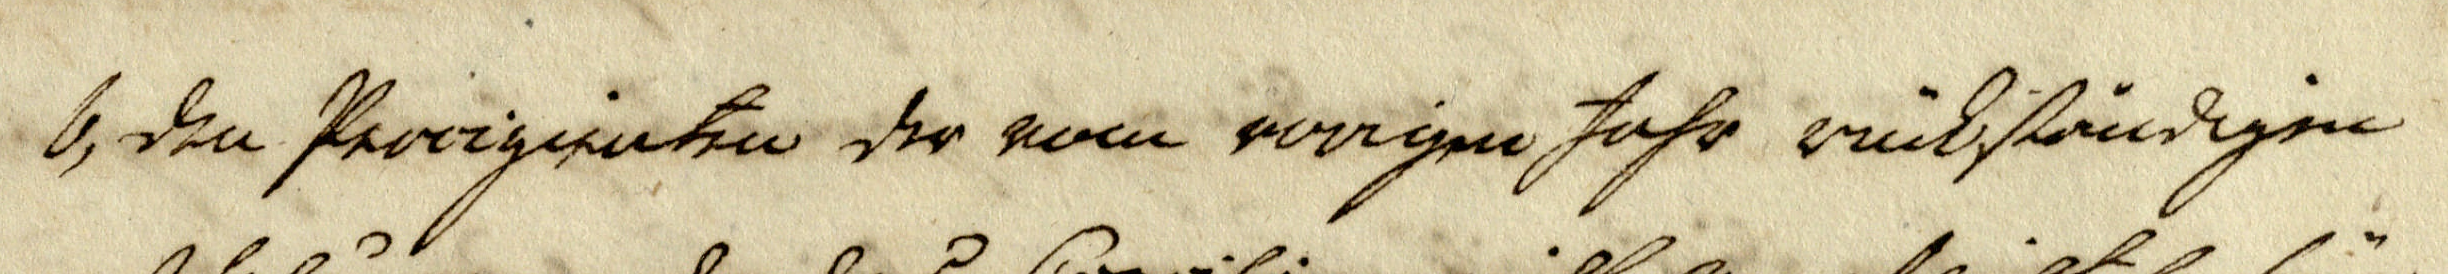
b, den Percipienten der vom vorigen Jahr rückständigen
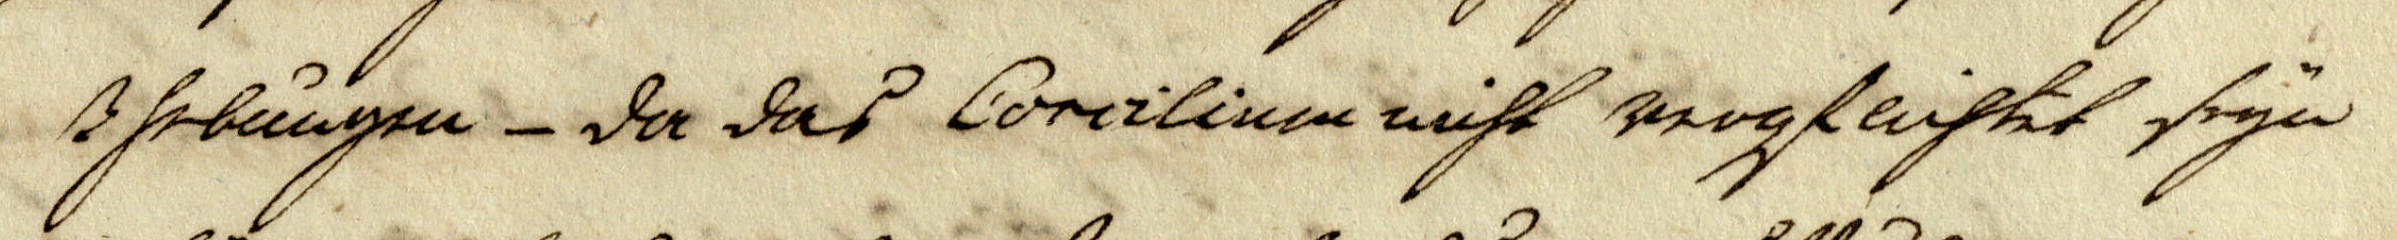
3 Hebungen da das Concilium nicht verpflichtet seÿn
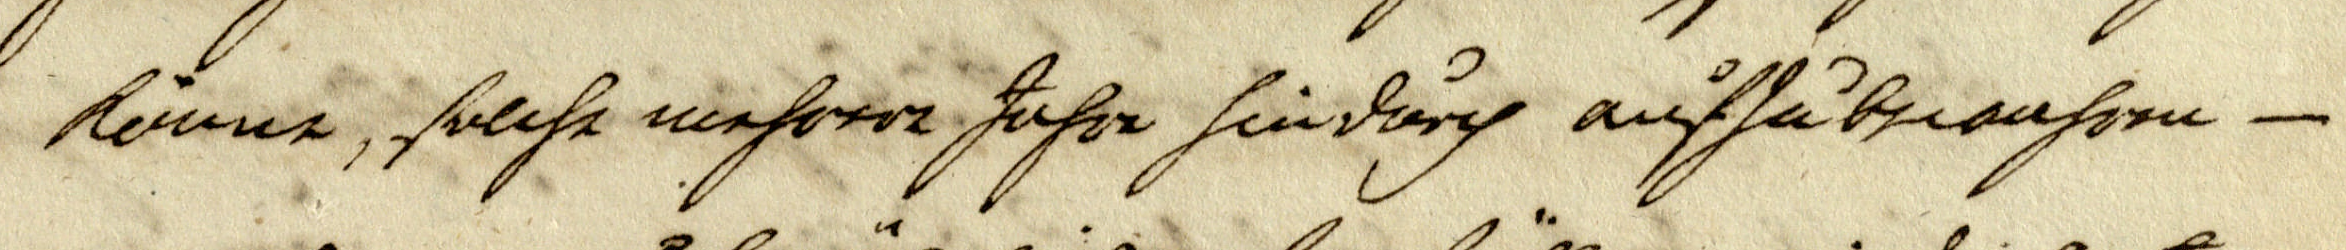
könne, solche mehrere Jahre hindurch aufzubewahren
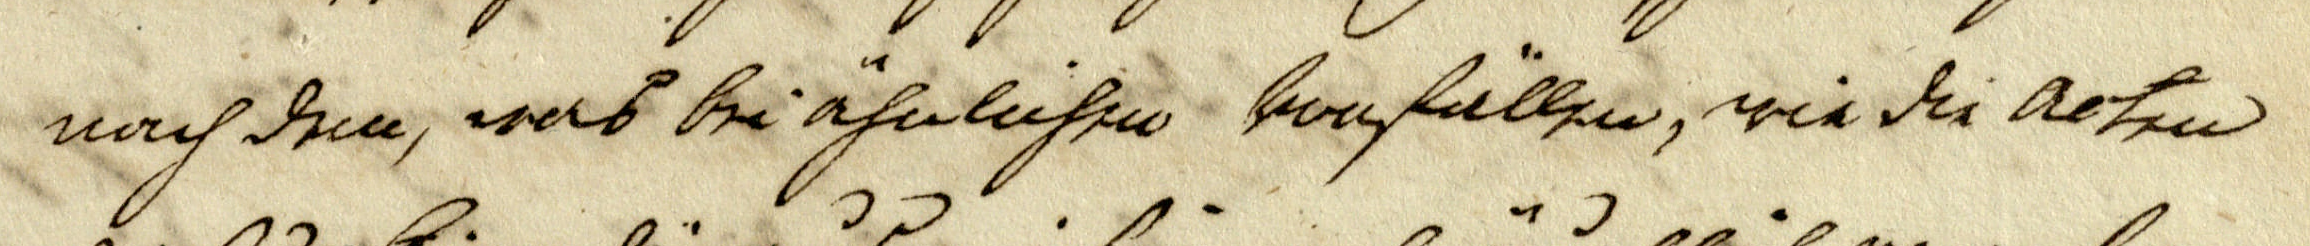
nach dem, was bei ähnlichen Vorfällen, wie die Acten
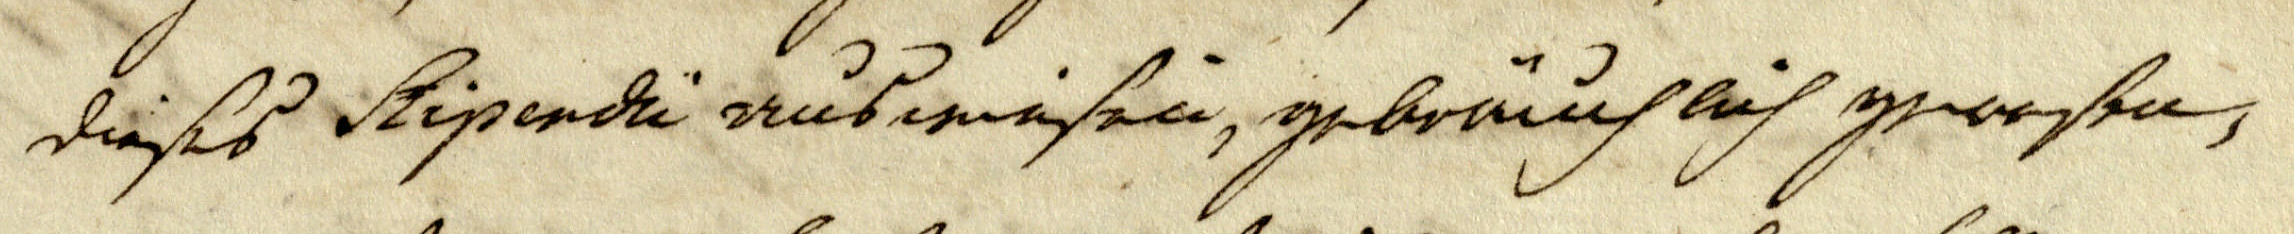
dieses Stipendii auswiesen, gebräuchlich gewesen,
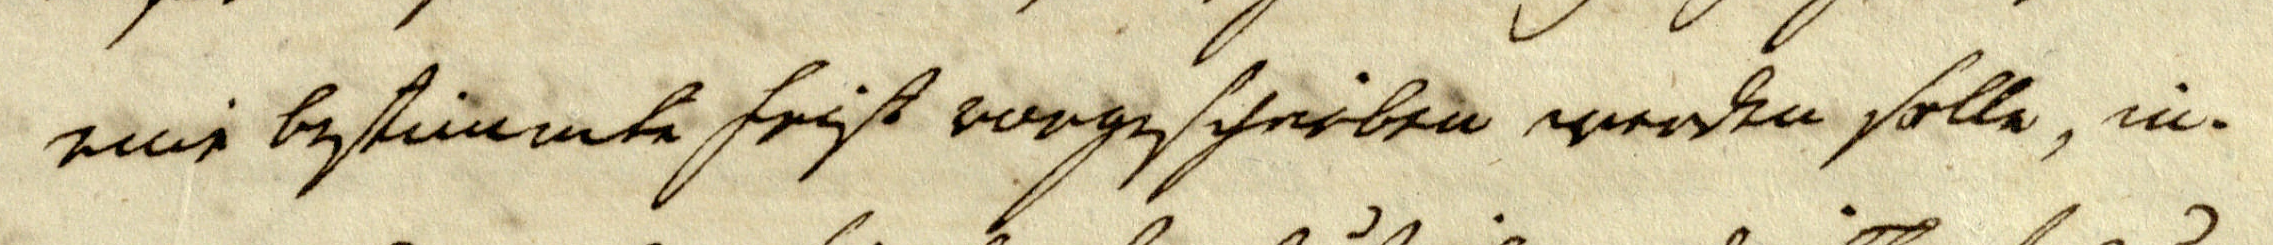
eine bestimmte Frist vorgeschrieben werden solle, in¬
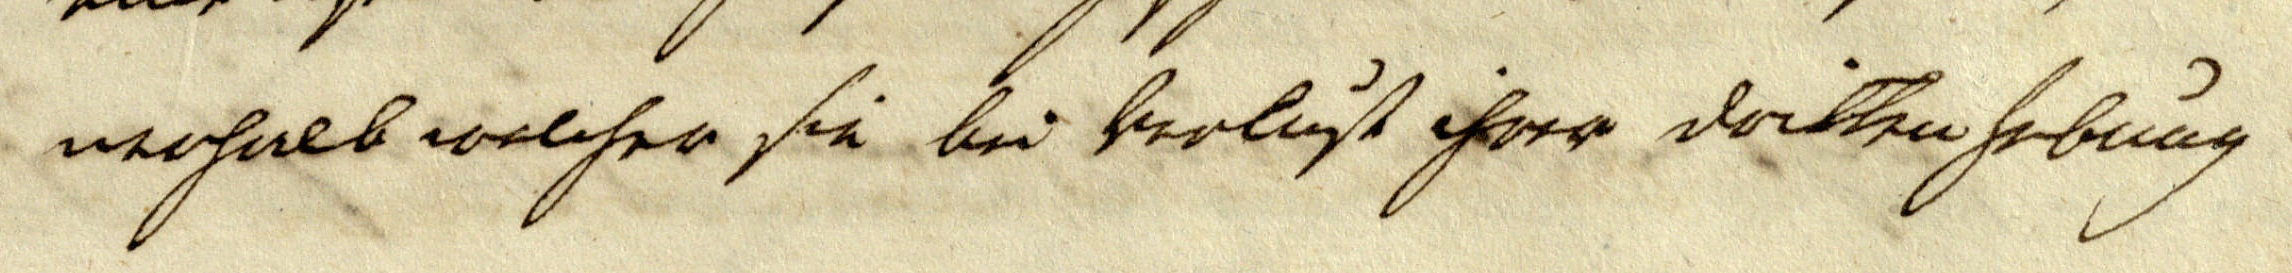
nerhalb welcher sie bei Verlust ihrer dritten Hebung
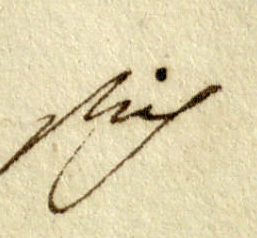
sich
